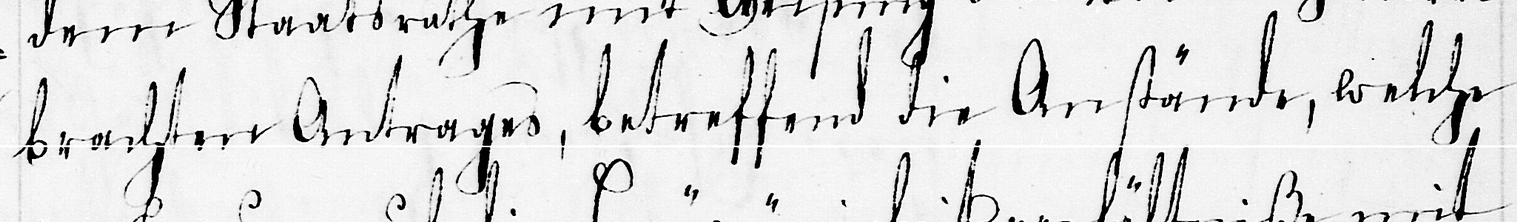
brachten Antrages, betreffend die Anstände, welche
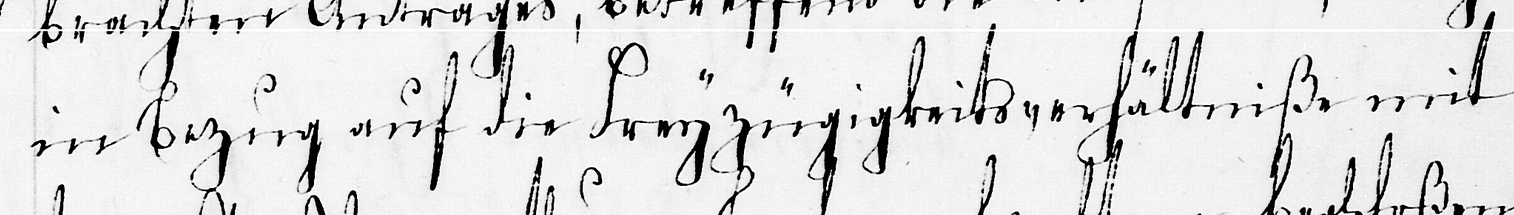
in Bezug auf die Freyzügigkeitsverhältniße mit
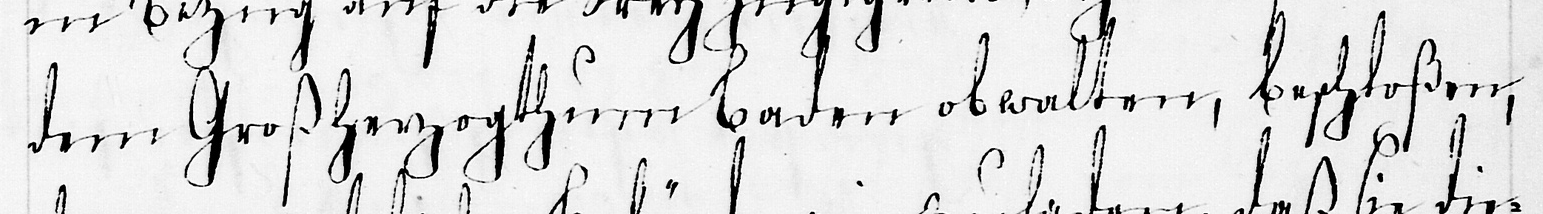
dem Großherzogthum Baden obwalten, beschloßen,
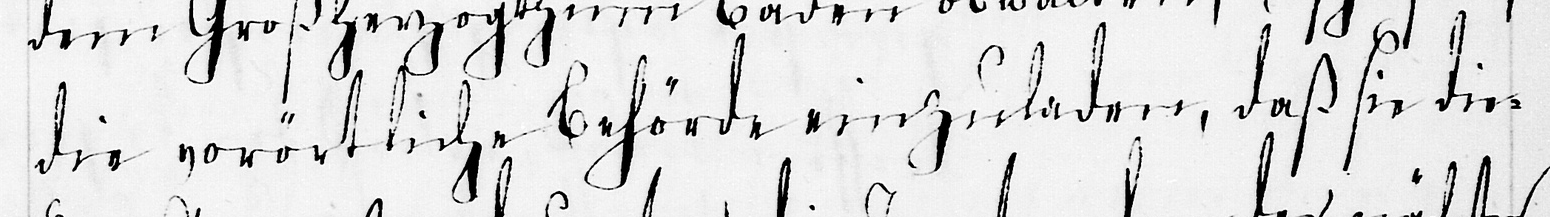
die vorörtliche Behörde einzuladen, daß sie die¬
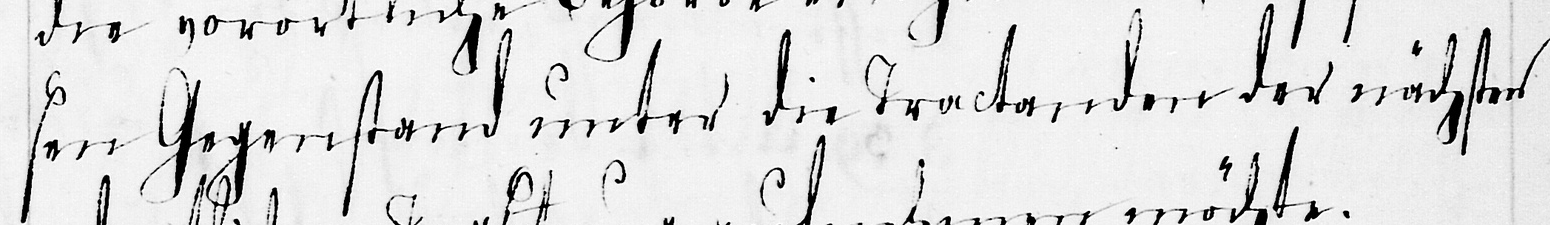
sen Gegenstand unter die Tractanden der nächsten
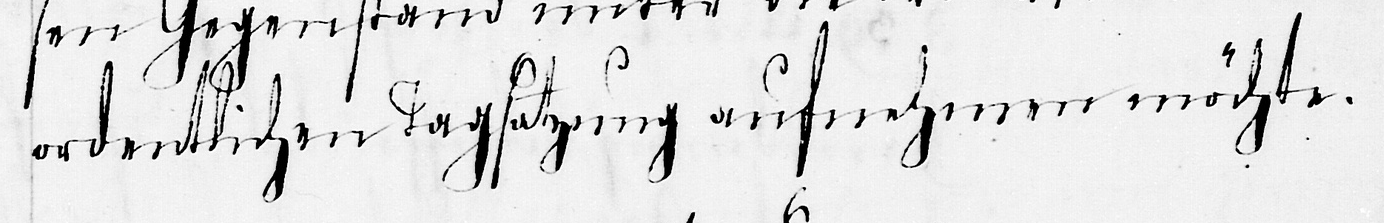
ordentlichen Tagsatzung aufnehmen möchte.
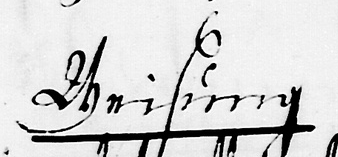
Weisung
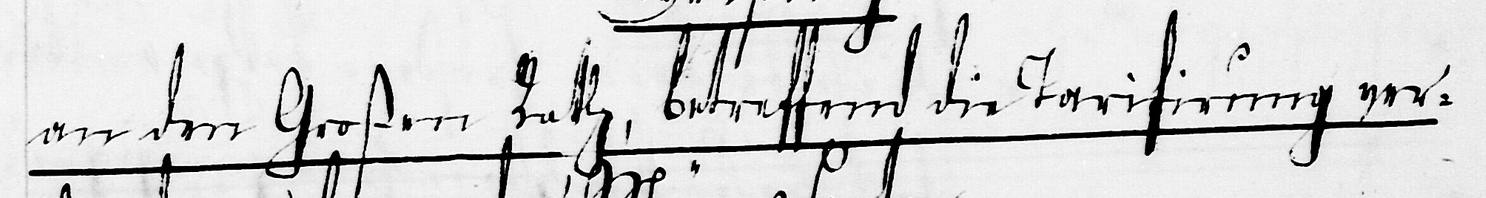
an den Großen Rath, betreffend die Tarifirung ver¬
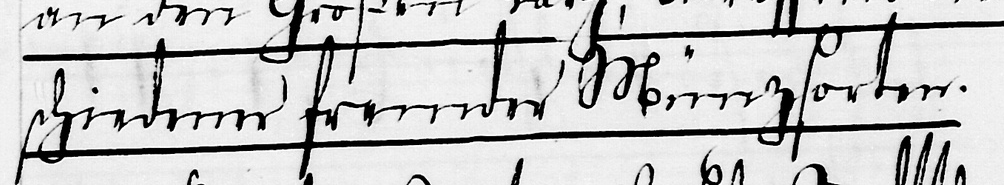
schiedener fremder Münzsorten.
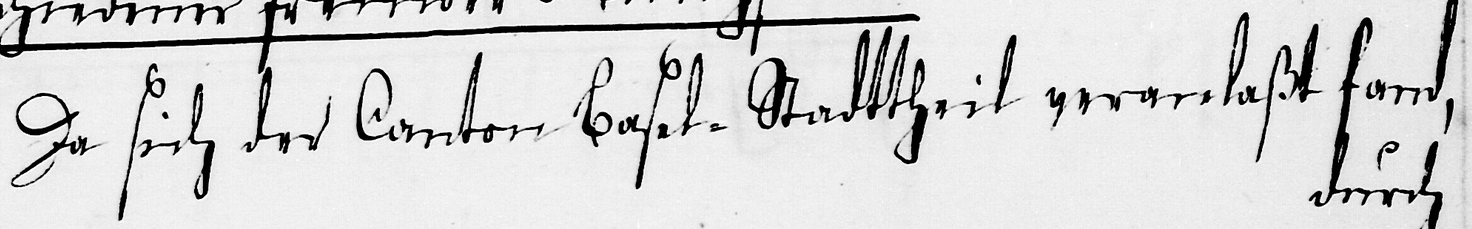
Da sich der Canton Basel-Stadttheil veranlaßt fand,
